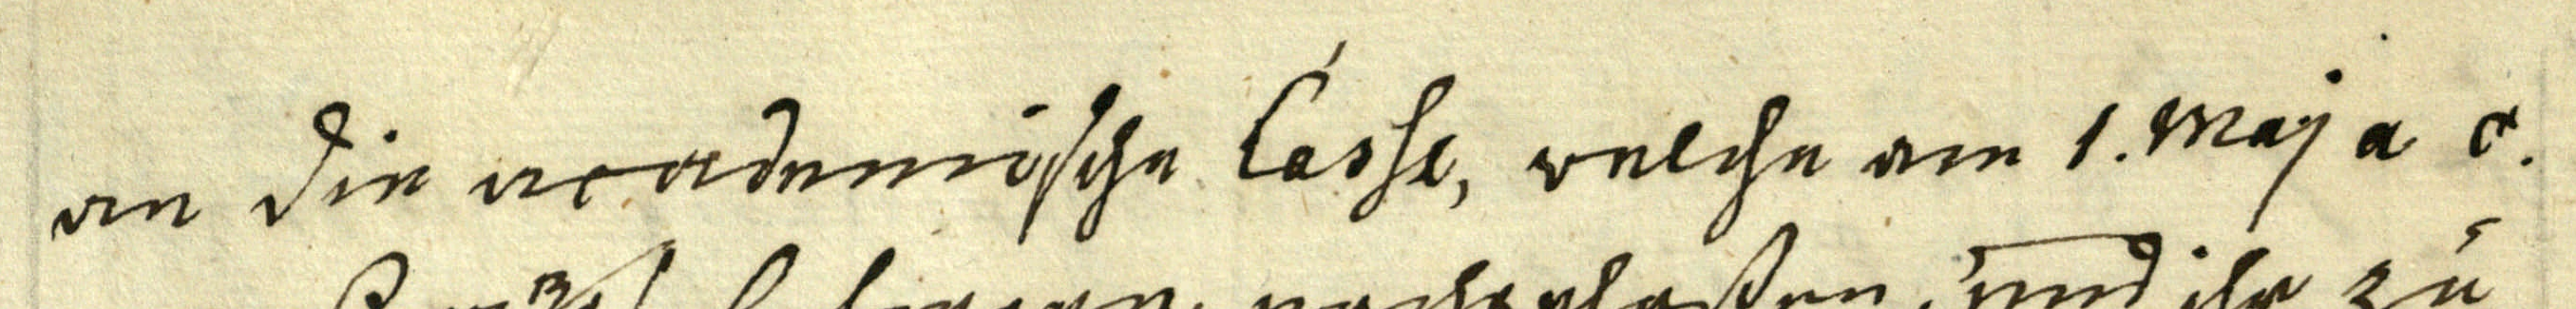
an die academische Casse, welche an 1. Maÿ a c.¬
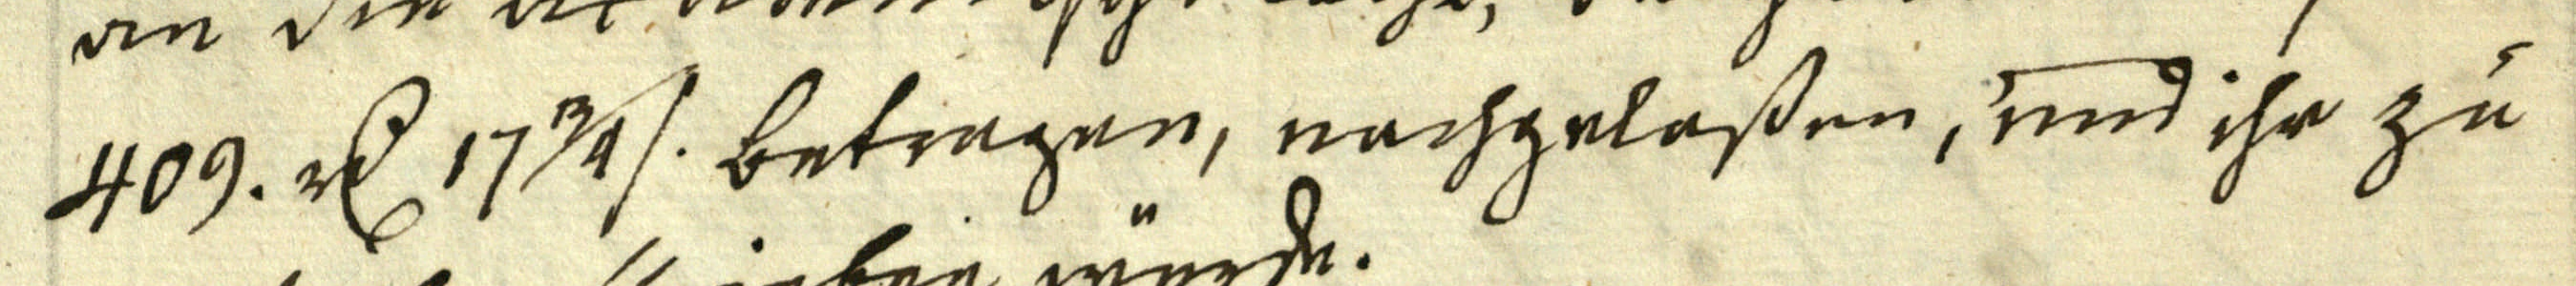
409. rl 17 ¾ s. betragen, nachgelaßen, und ihr zu
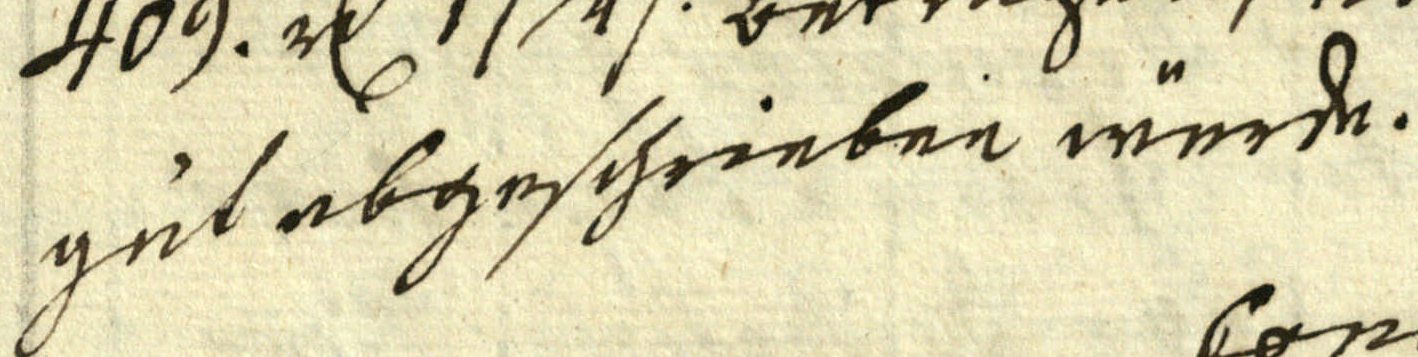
gut abgeschrieben würde.
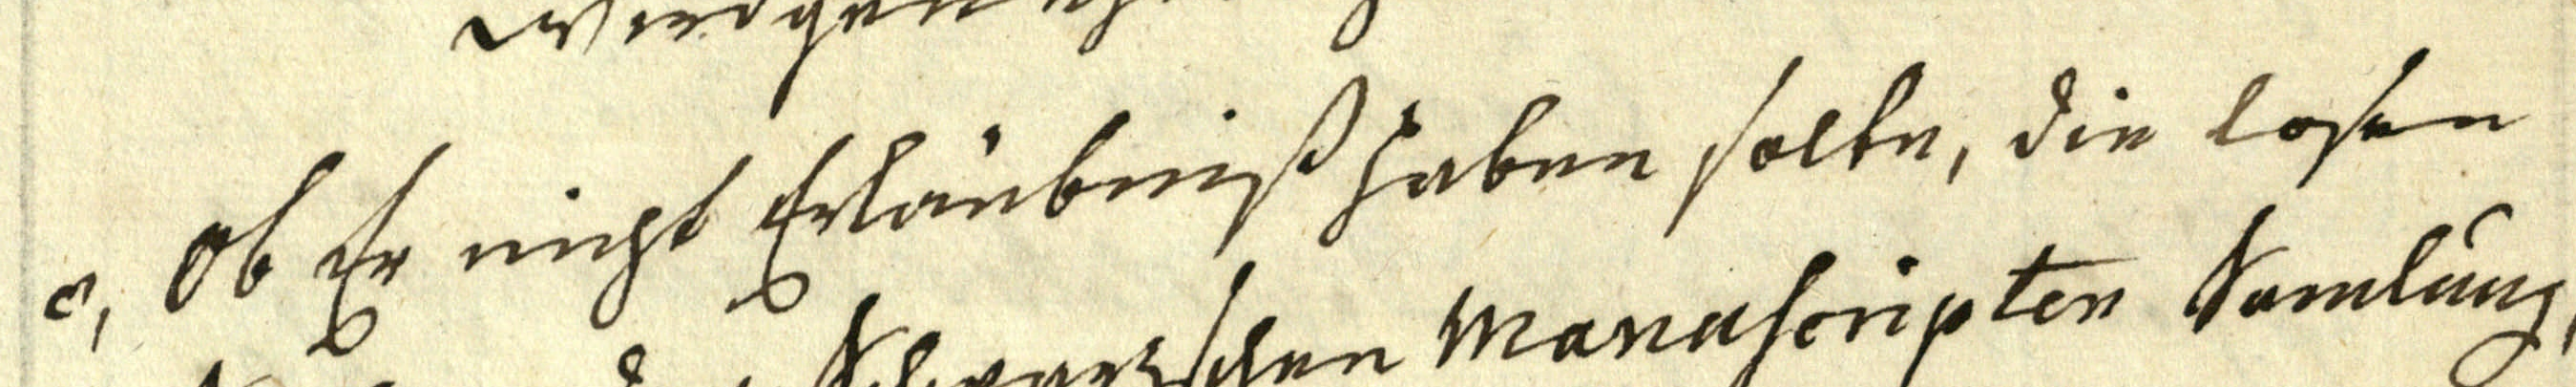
c, ob Er nicht Erlaubniß haben solte, die losen
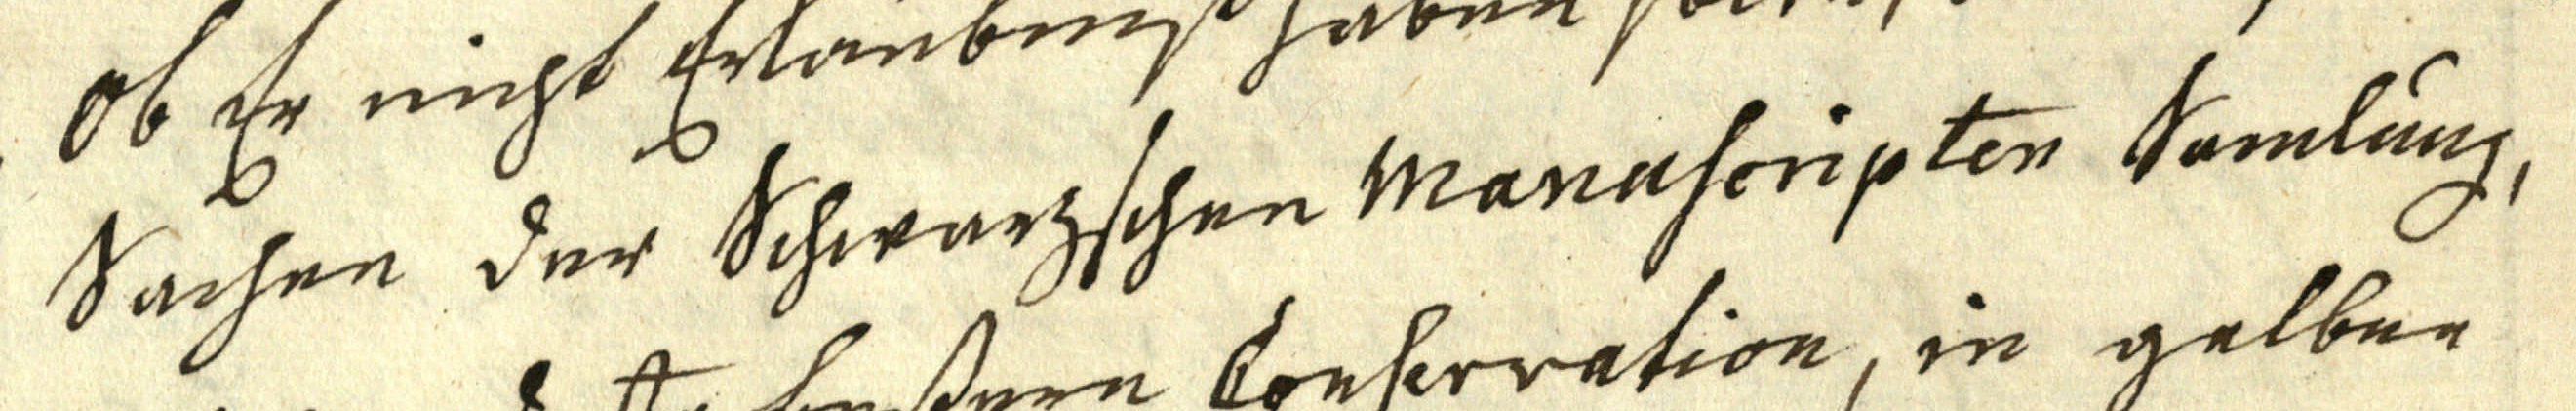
Sachen der Schwarzschen Manuscripten Samlung,
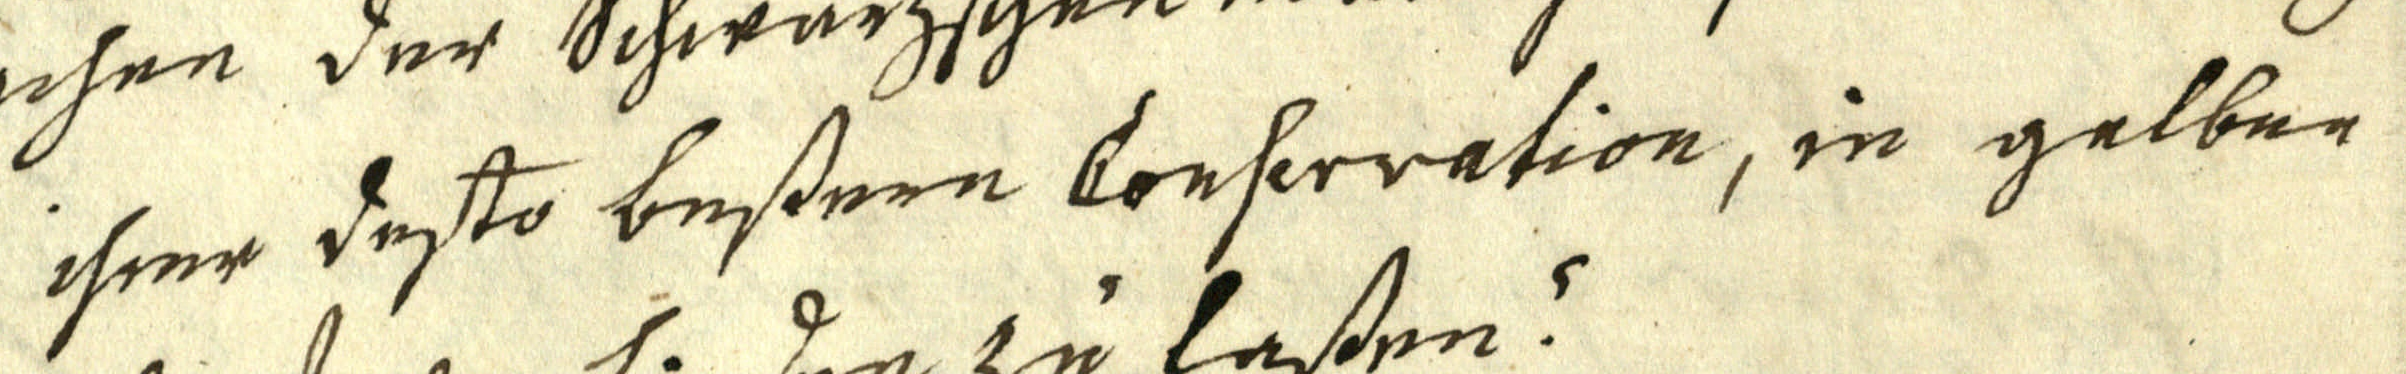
zu ihrer desto beßern Conservation, in gelben
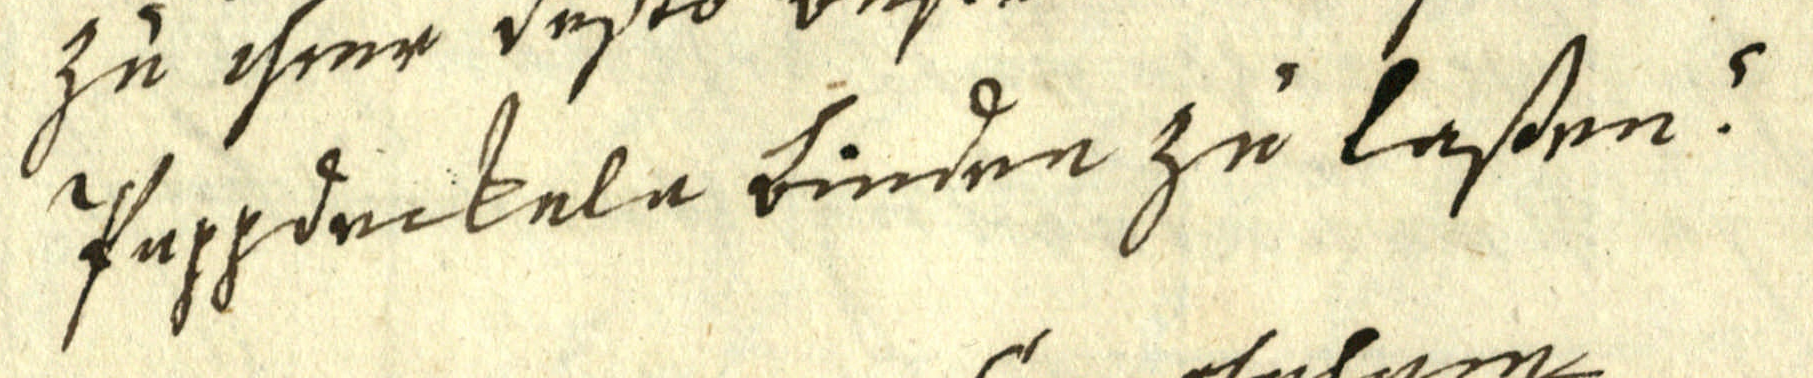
Pappdeckeln binden zu laßen?
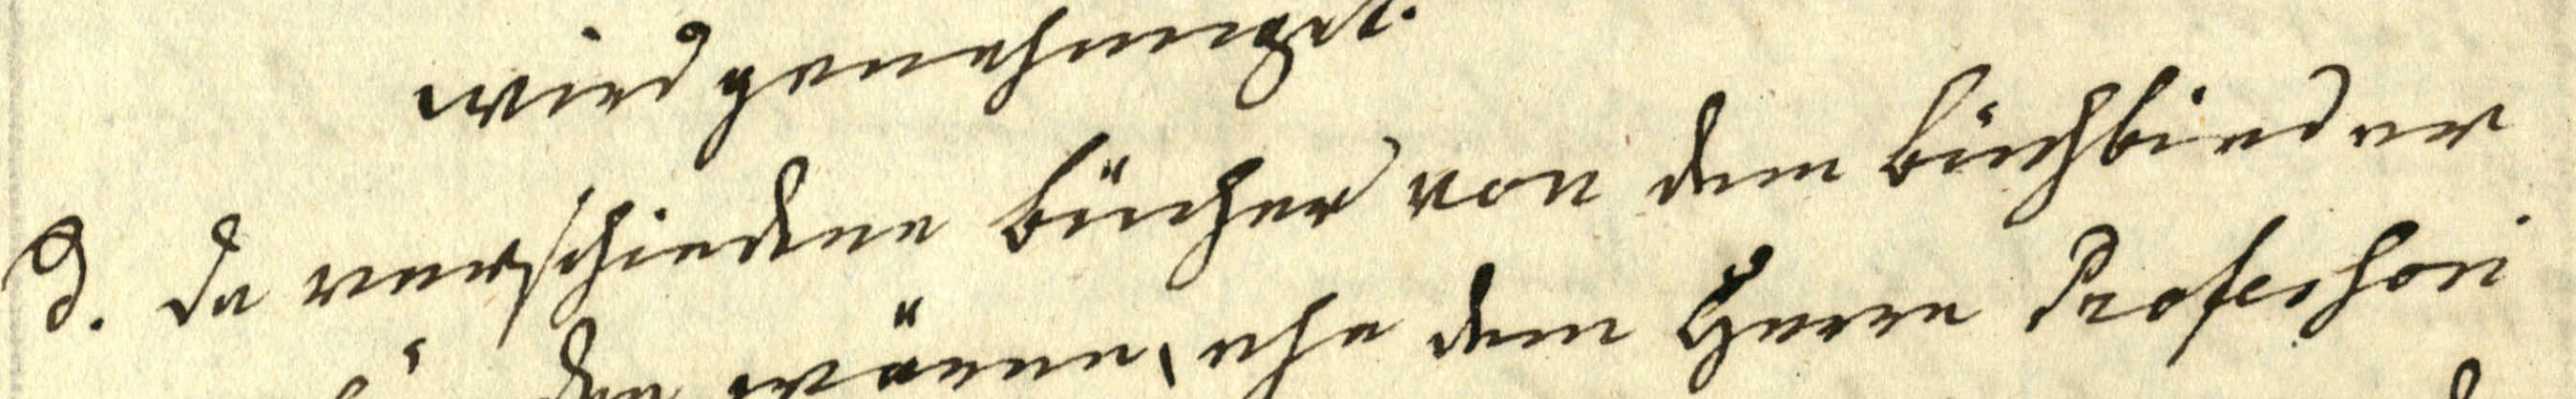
d. da verschiedene Bücher von dem Buchbinder
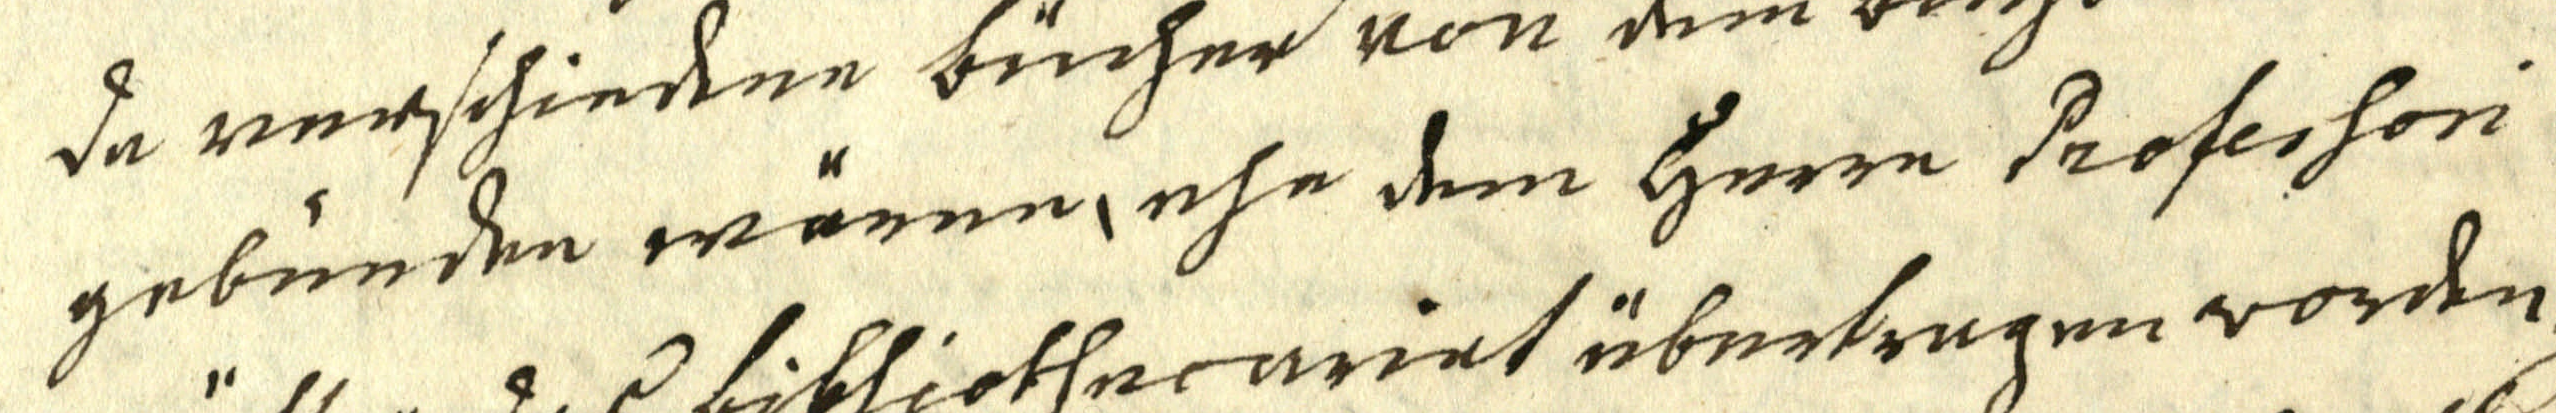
gebunden wären, ehe dem Herrn Professori
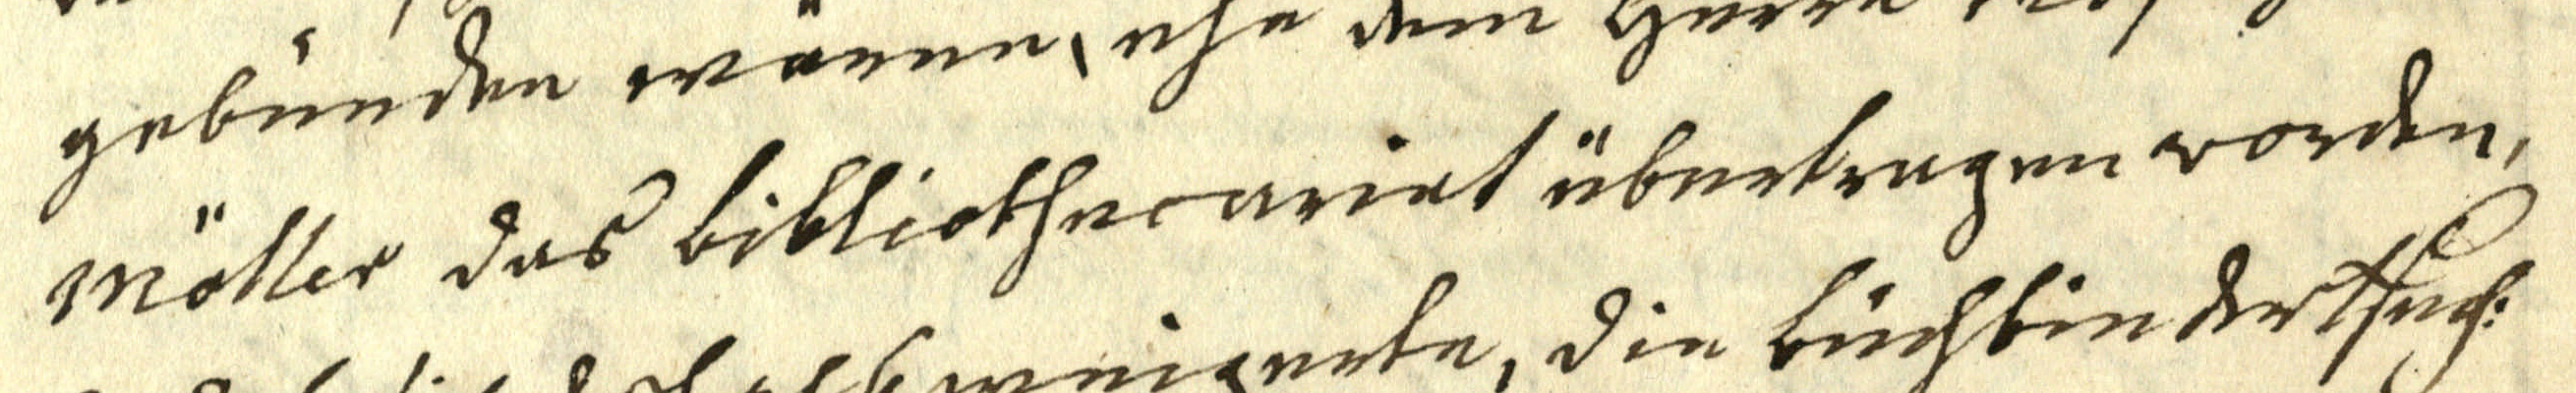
Möller das Bibliothecariat übertragen worden,
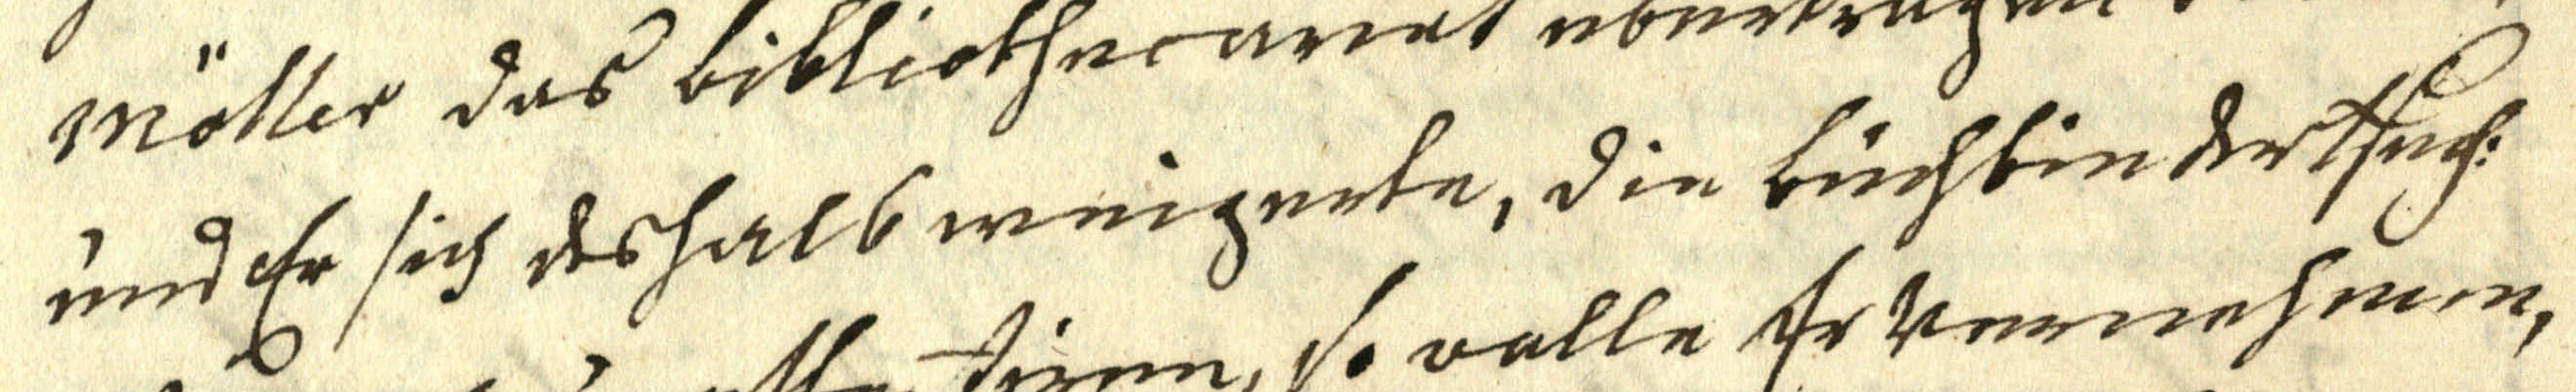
und Er sich deshalb weigerte, die BuchbinderRech¬
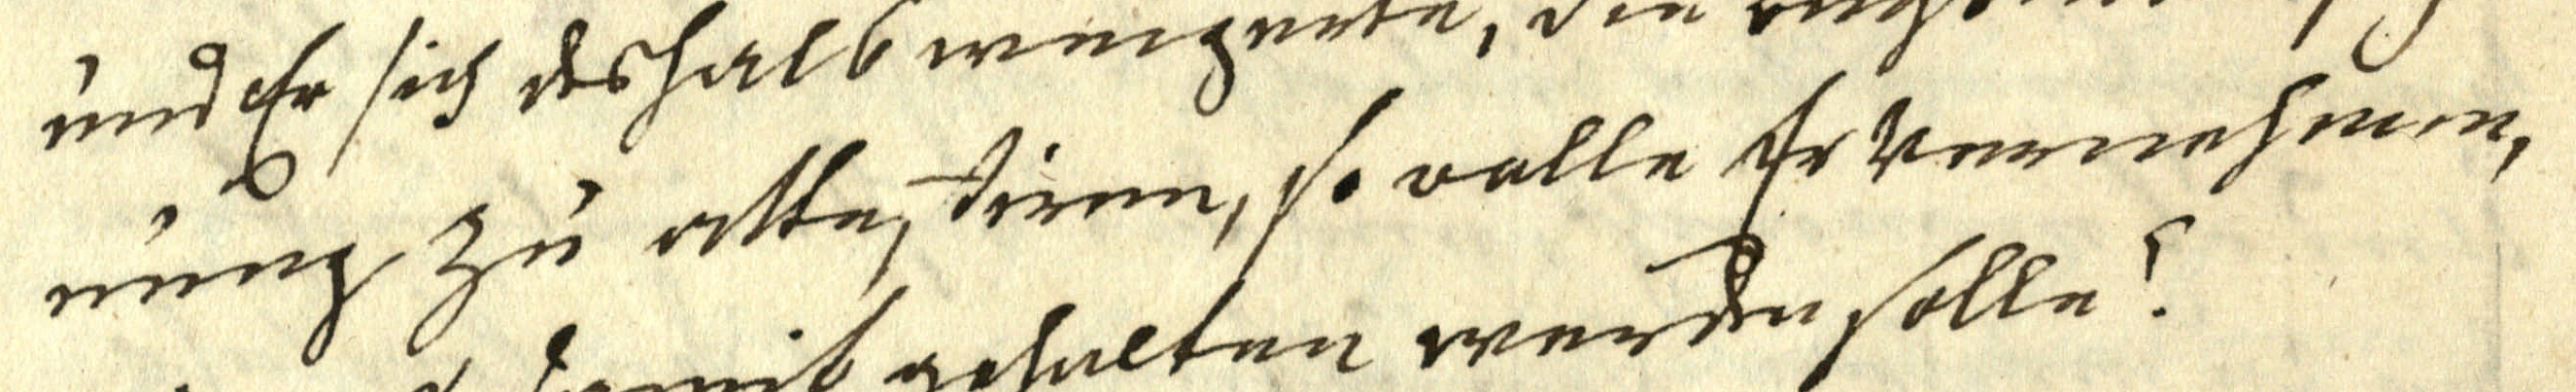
nung zu attestiren, so wolle Er vernehmen,
